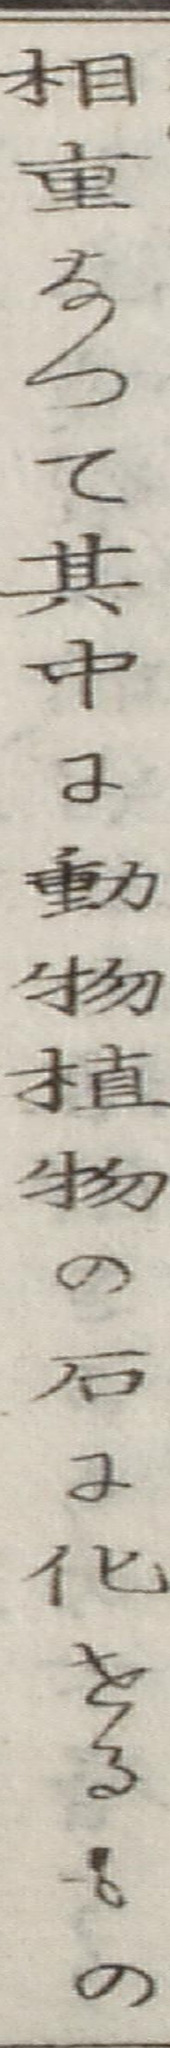相重なつて其中に動物植物の石に化せるもの
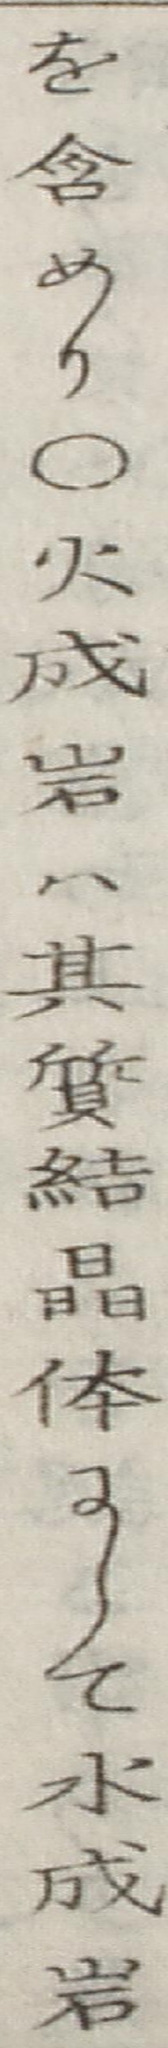を含めり〇火成岩は其質結晶体にして、水成岩
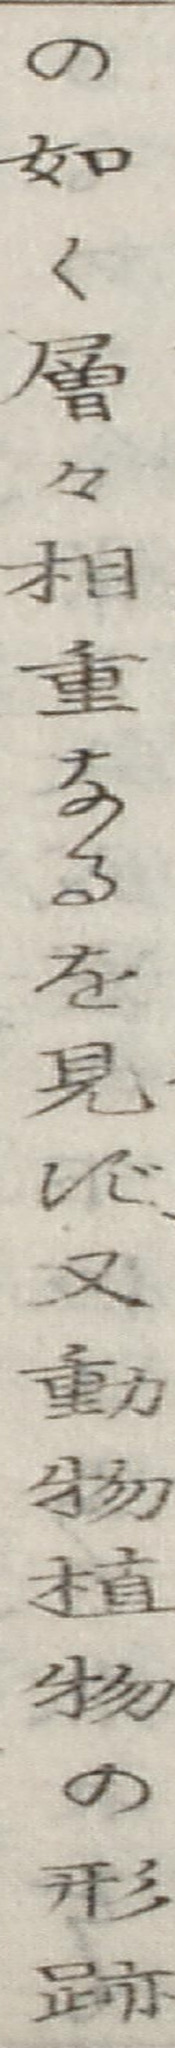の如く層々相重なるを見ず、又動物植物の形跡
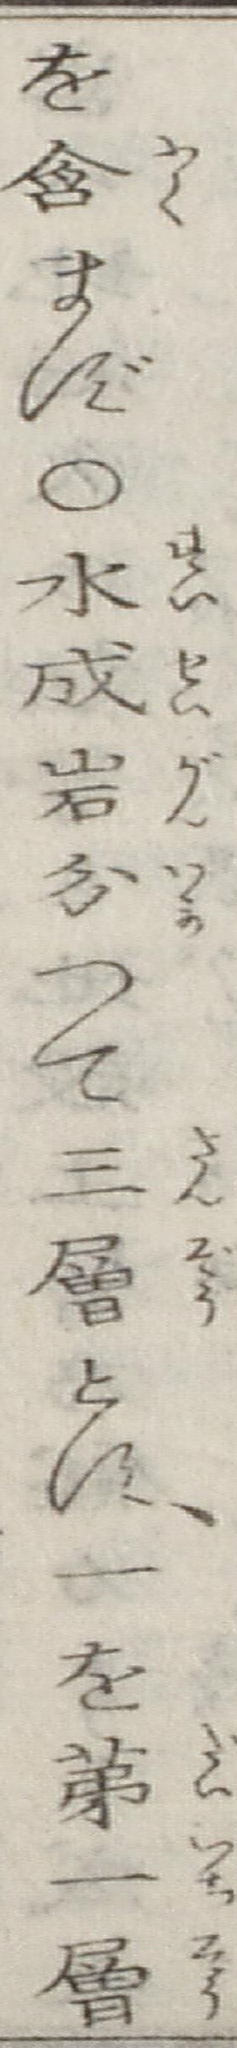を含まず〇水成岩分つて三層とす、一を第一層
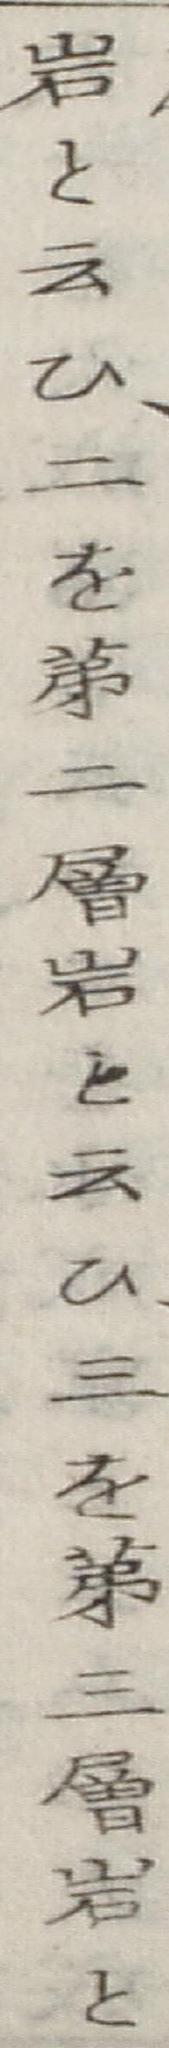岩と云ひ、二を第二層岩と云ひ、三を第三層岩と
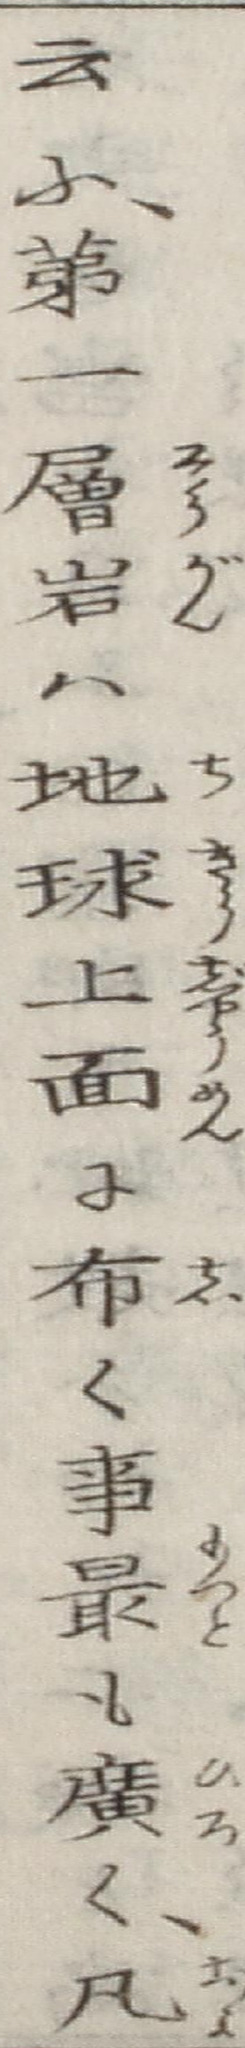云ふ、第一層岩は、地球上面に布く事最も広く.、凡
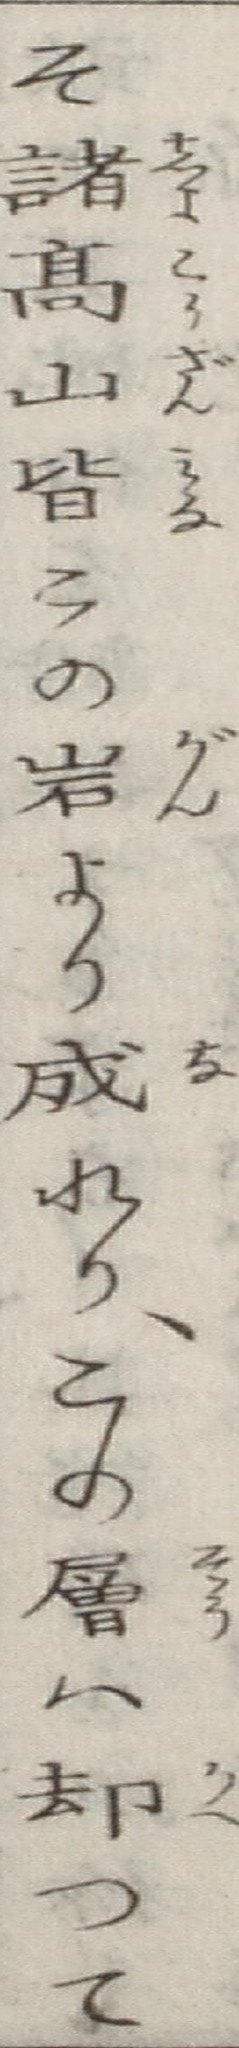そ諸高山皆この岩より成れり、この層は却つて
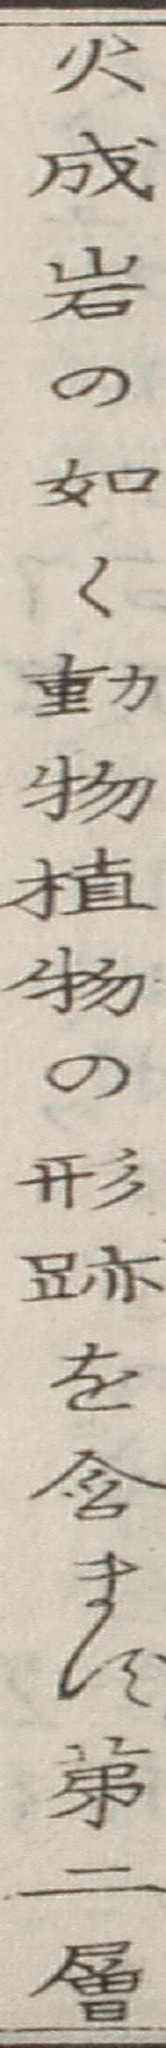火成岩の如く動物植物の形跡を含まず、第二層
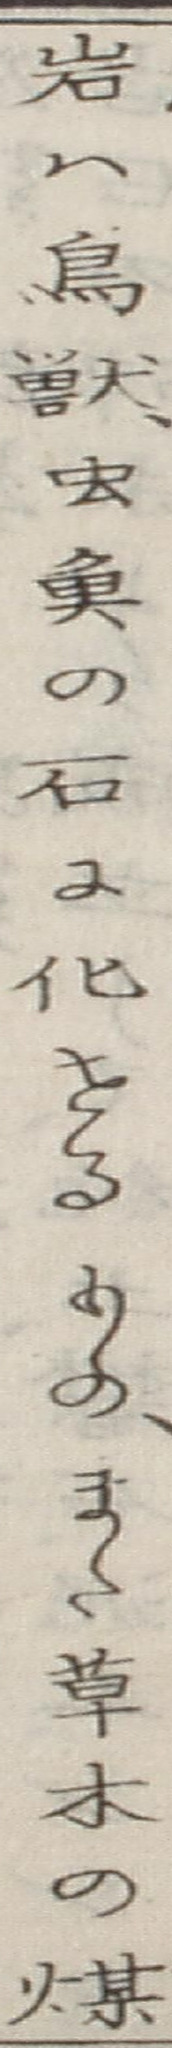岩は鳥獣、虫魚の石に化せるもの、また草木の煤
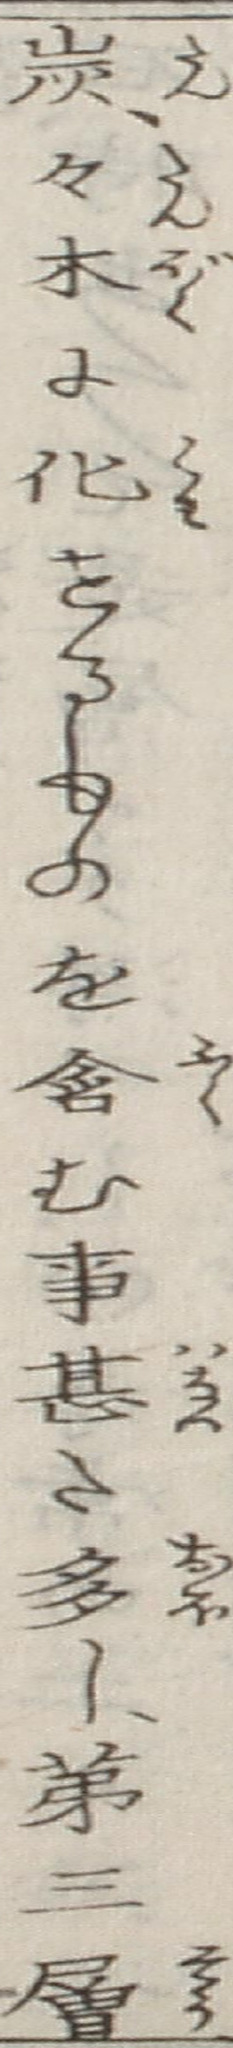炭、々木に化せるものを含むこと甚だ多し、第三層
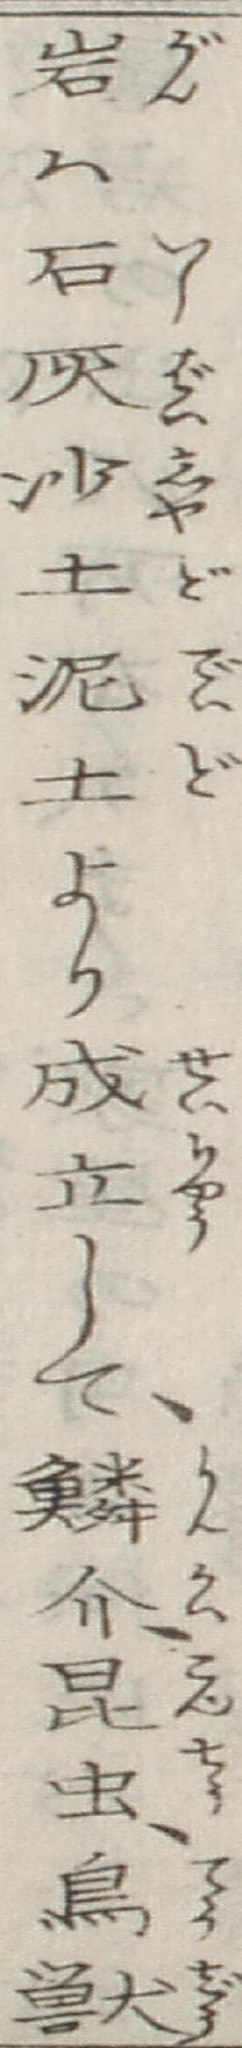岩は石灰沙土泥土より成立して、鱗介、昆虫、鳥獣
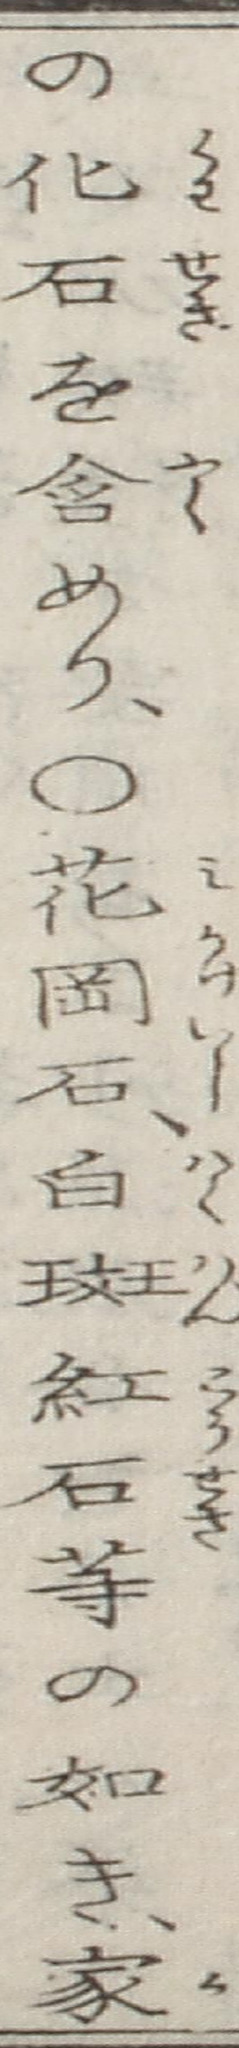の化石を含めり、〇花崗岩、白斑紅石等の如き、家
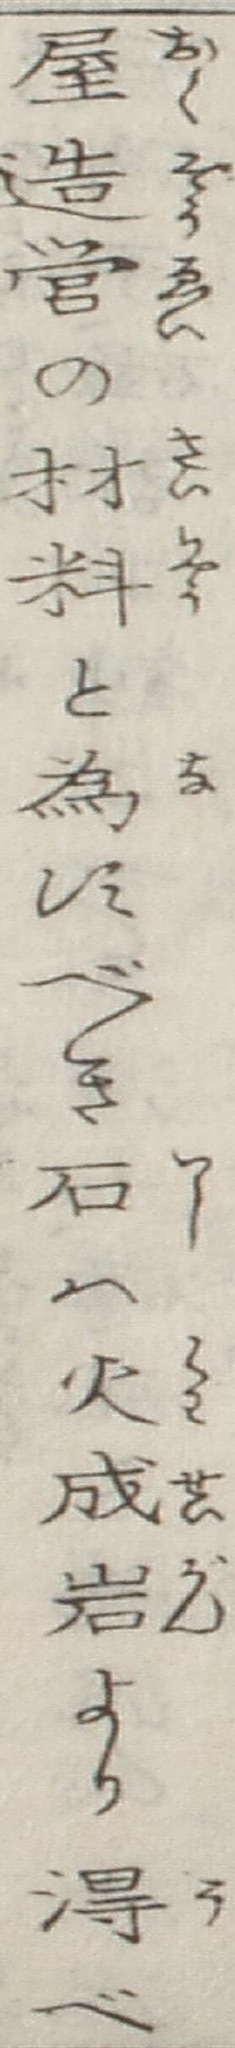屋造営の材料と為すべき石は火成岩より得べ
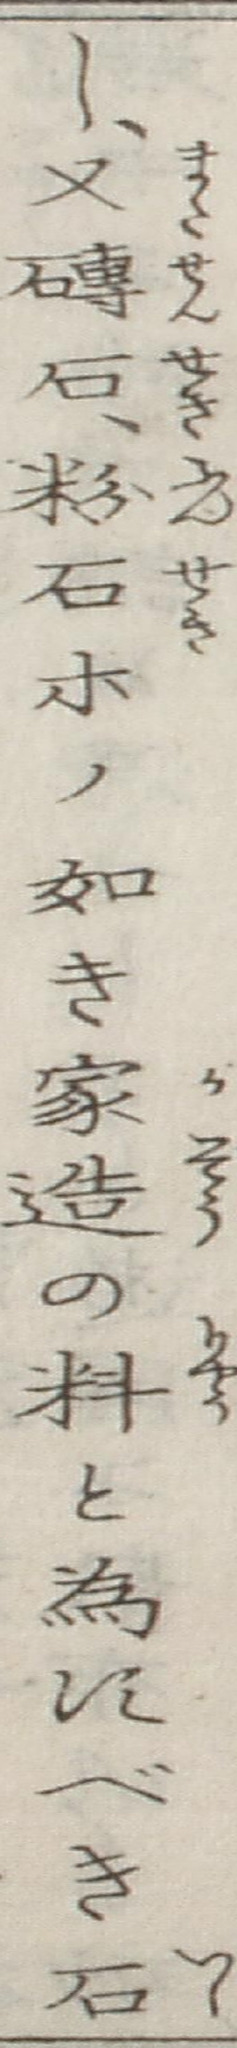し、又甎石、粉石等の如き家造の料と為すべき石
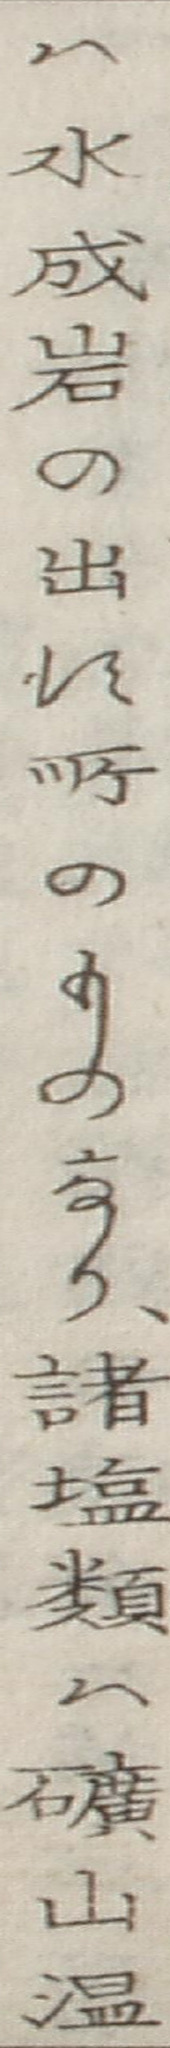は水成岩の出す所のものなり、諸塩類は鉱山温
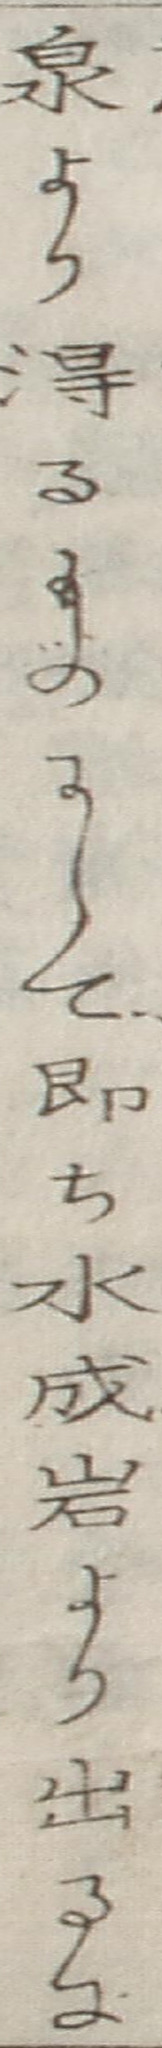泉より得るものにして、即ち水成岩より出るに
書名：訓蒙　天然地理學　上
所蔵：東京大学地震研究所図書室 Earthquake Research Institute Library, The University of Tokyo, JAPAN
